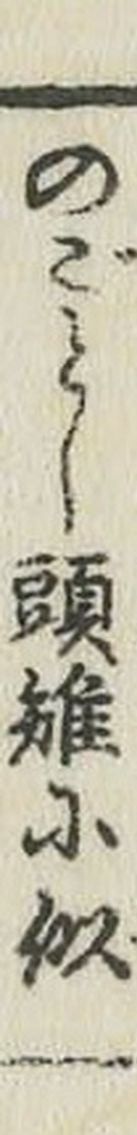のごとし頭雉に似
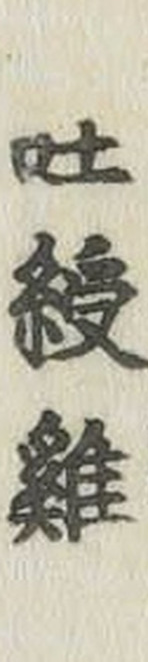吐綬鶏
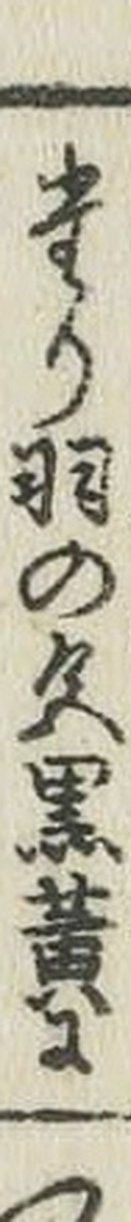たり羽の色黒黄に
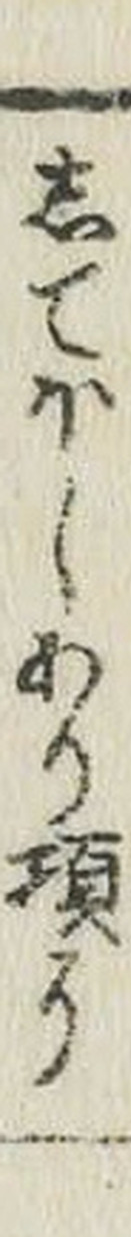してほしあり項に
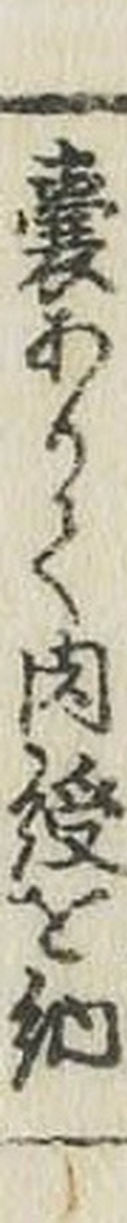嚢ありて肉綬を納
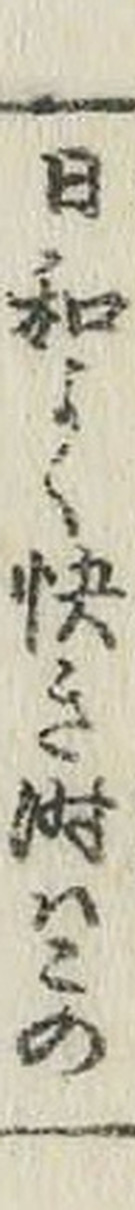日和よく快き時はこの
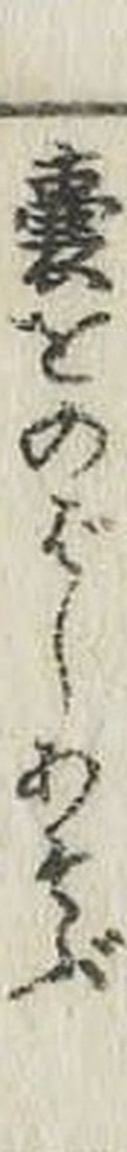嚢をのばしあそぶ
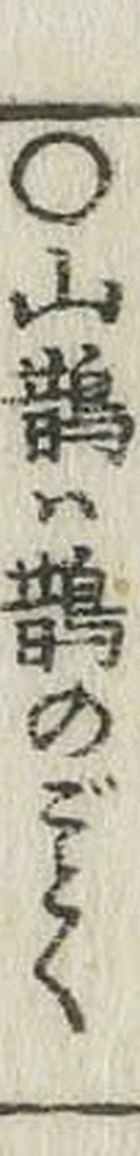○山鵲は鵲のごとく
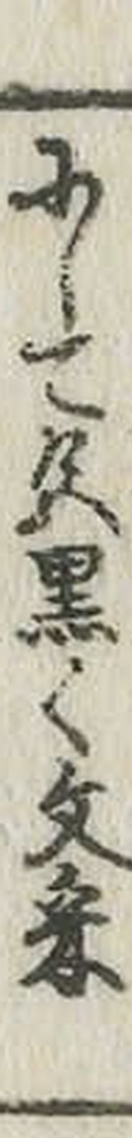にして色黒く文采
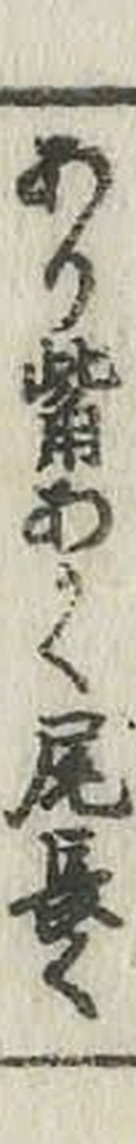あり觜あかく尾長く
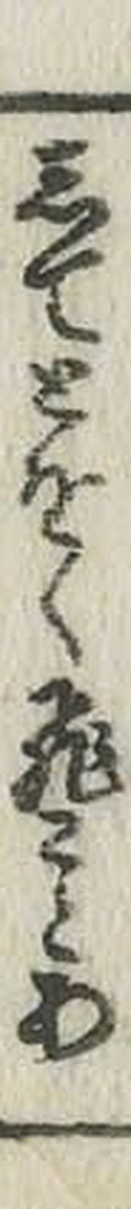してとをく飛ことあ
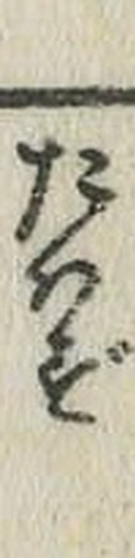たはず

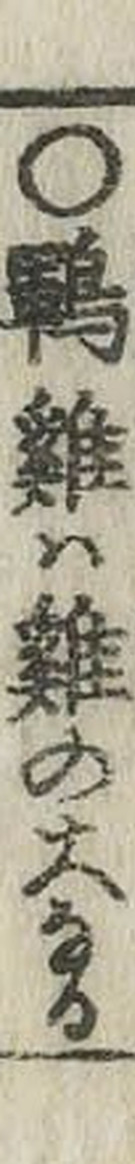○鶤鶏は鶏の大なる
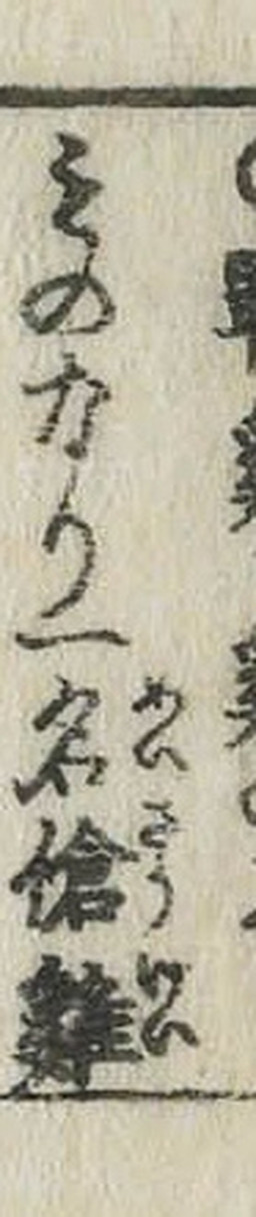ものなり一名傖鶏
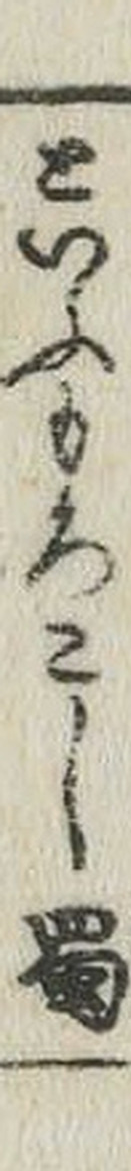といふもろこし蜀
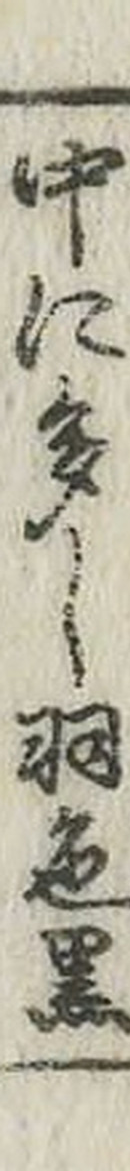中に多し羽色黒
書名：増補頭書訓蒙図彙大成 10巻 6:巻之12-13
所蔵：東京学芸大学教育コンテンツアーカイブ
